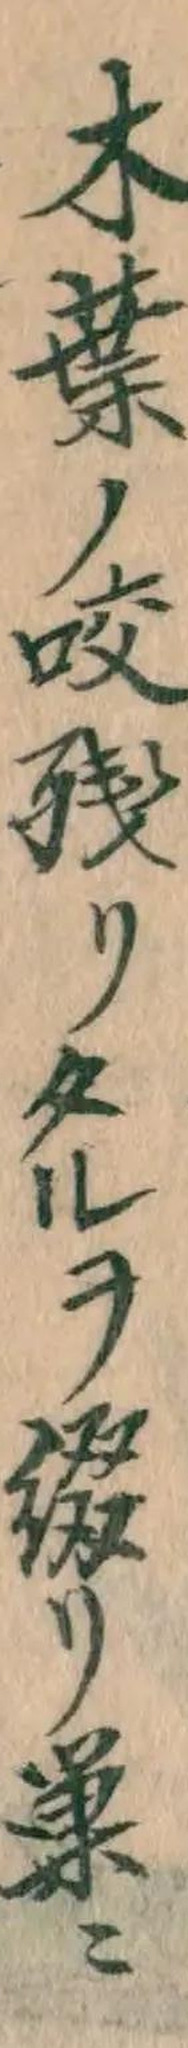木葉ノ咬残リタルヲ綴リ巣ニ
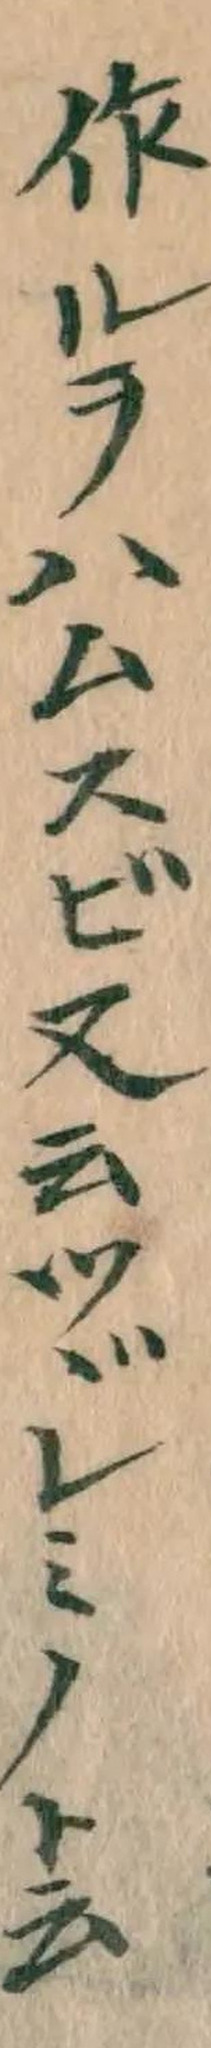作ルヲハムスビ又云ツヾレミノト云
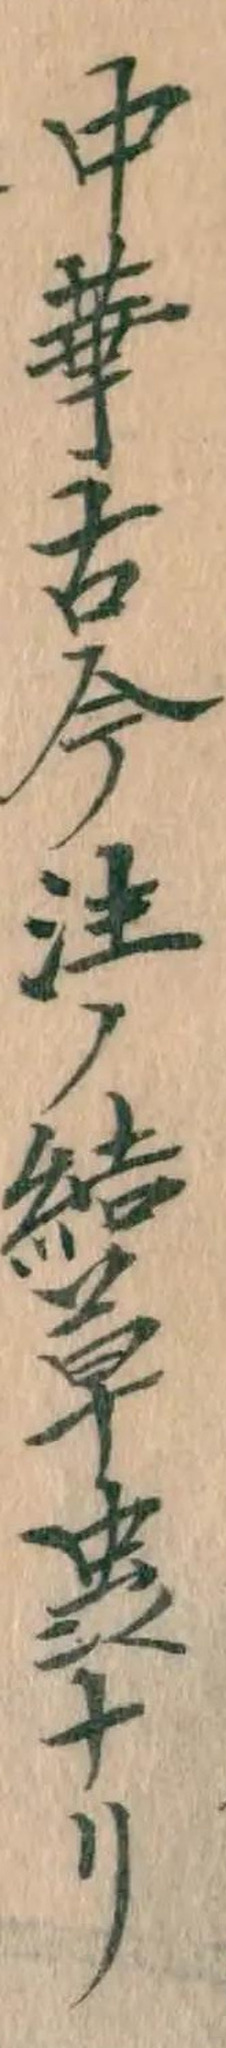中華古今注ノ結草蟲ナリ
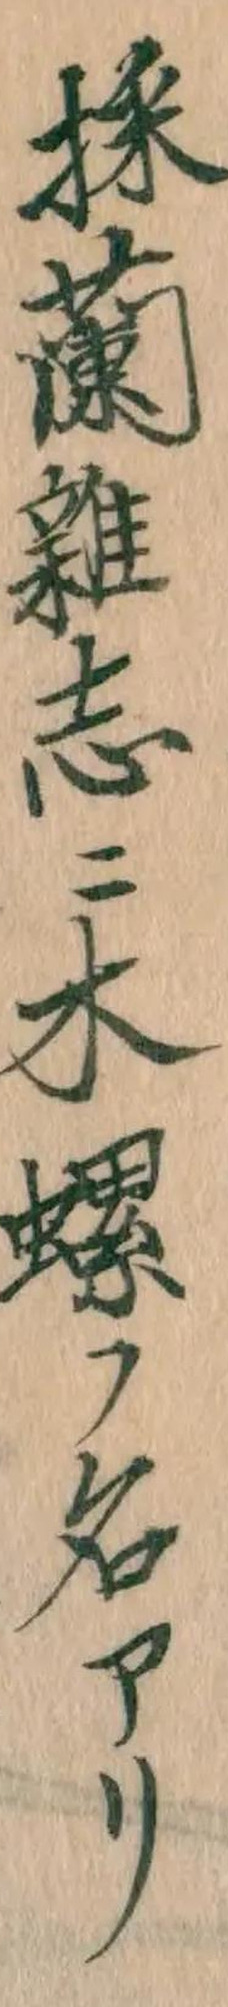採蘭雑志ニ木螺ノ名アリ
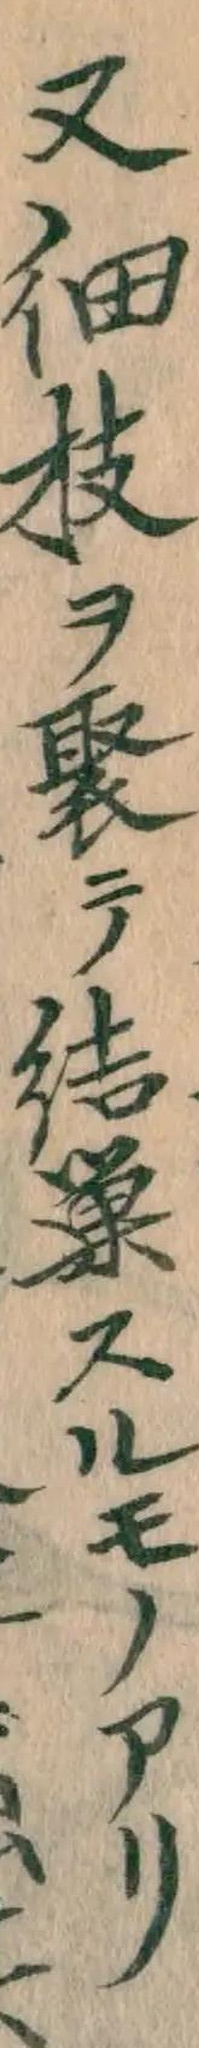又細枝ヲ聚テ結巣スルモノアリ
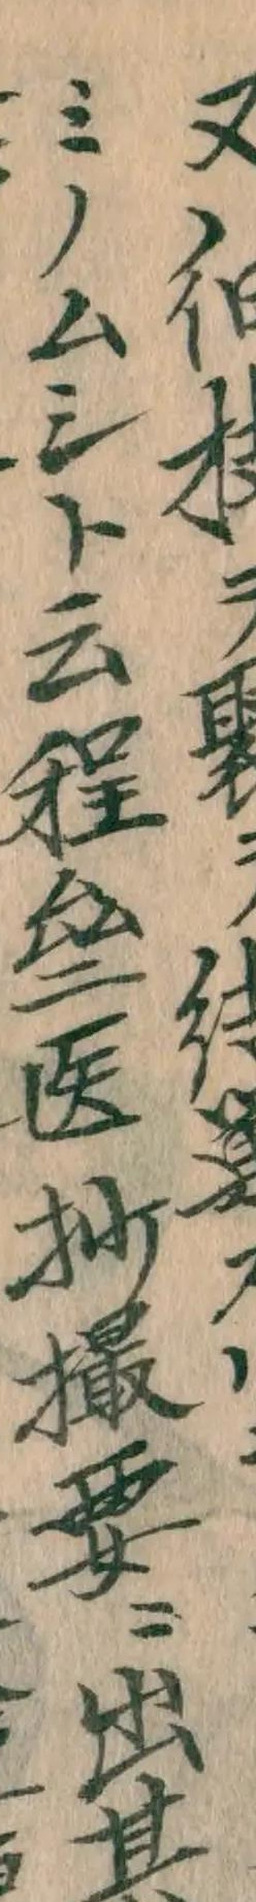ミノムシト云程亝医抄撮要ニ出其
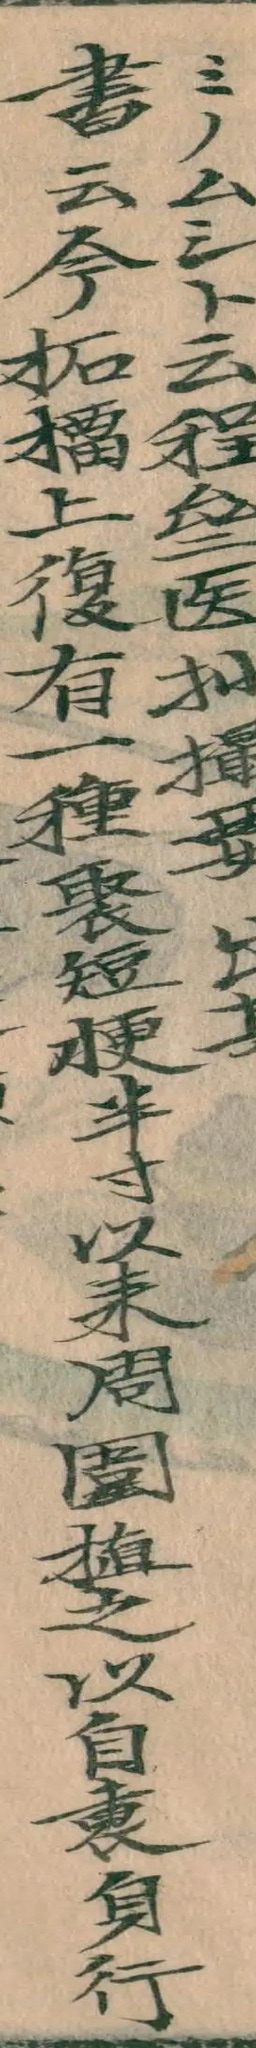書云今柘榴上復有一種聚短梗半寸以来周園植之以自裏身行
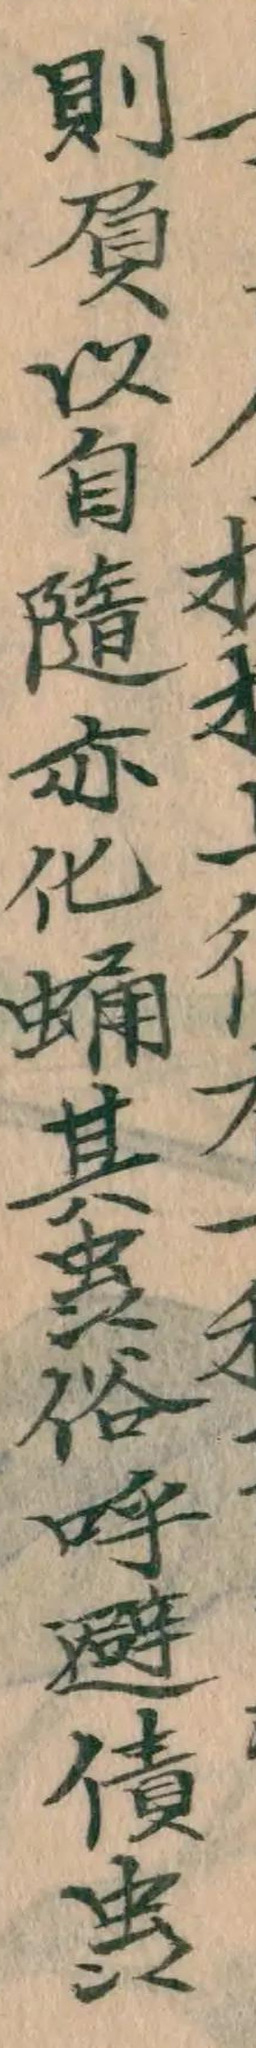則負以自随亦化蛹其虫俗呼避債虫
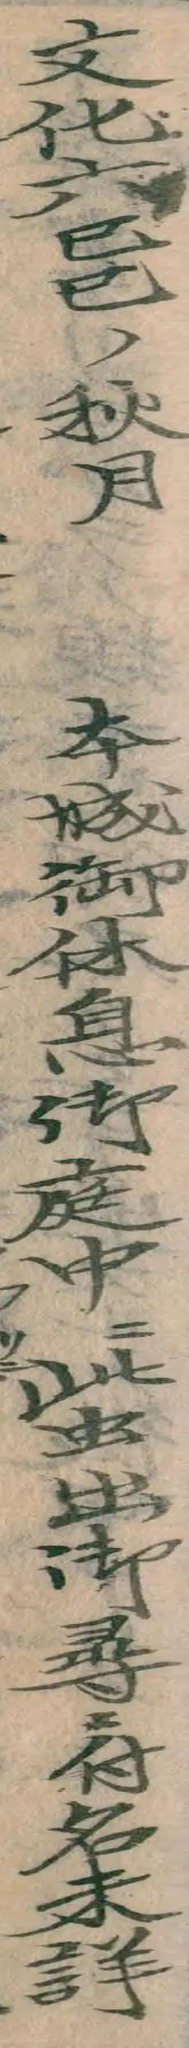文化六己巳ノ秋月本城御休息御庭中ニ此虫出御尋ニ付名未詳
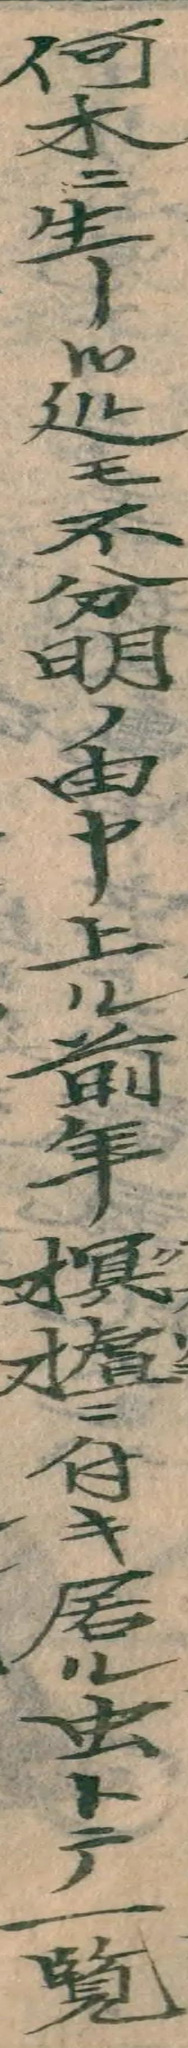何木ニ生し候処モ不分明ノ由申上ル前年榠樝ニ付キ居ル虫トテ一覧
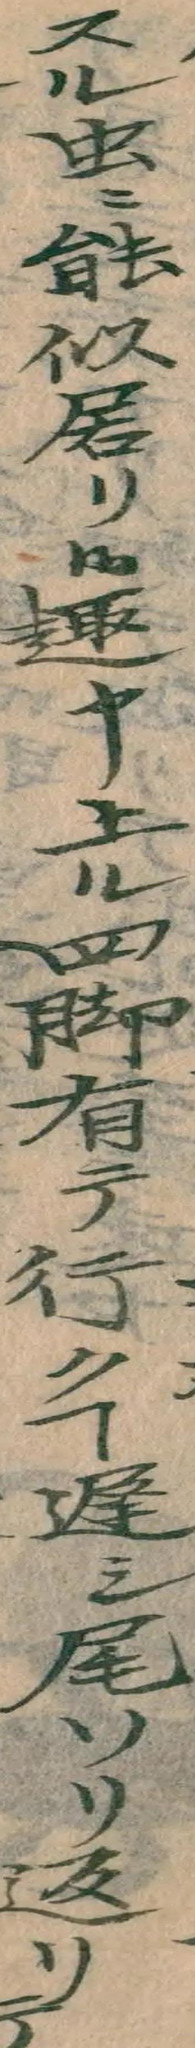スル虫ニ能似居リ候趣申上ル四脚有テ行クコト遅シ尾ソリ返リテ
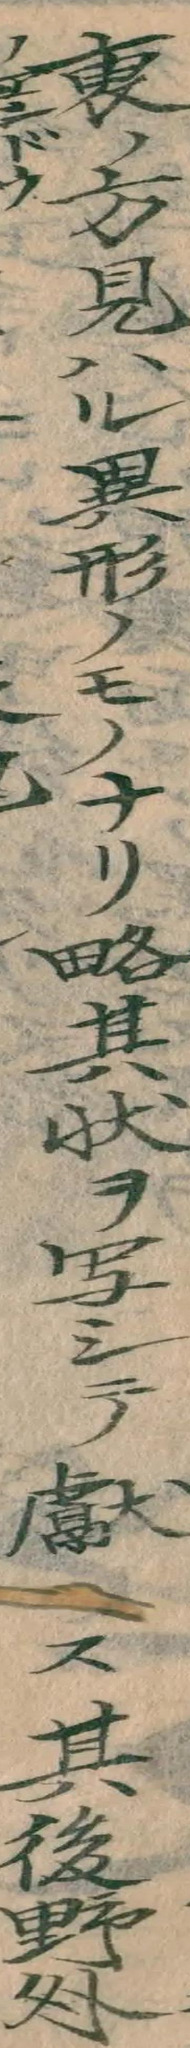裏ノ方見ハル異形ノモノナリ略其状ヲ写シテ献ス其後野外
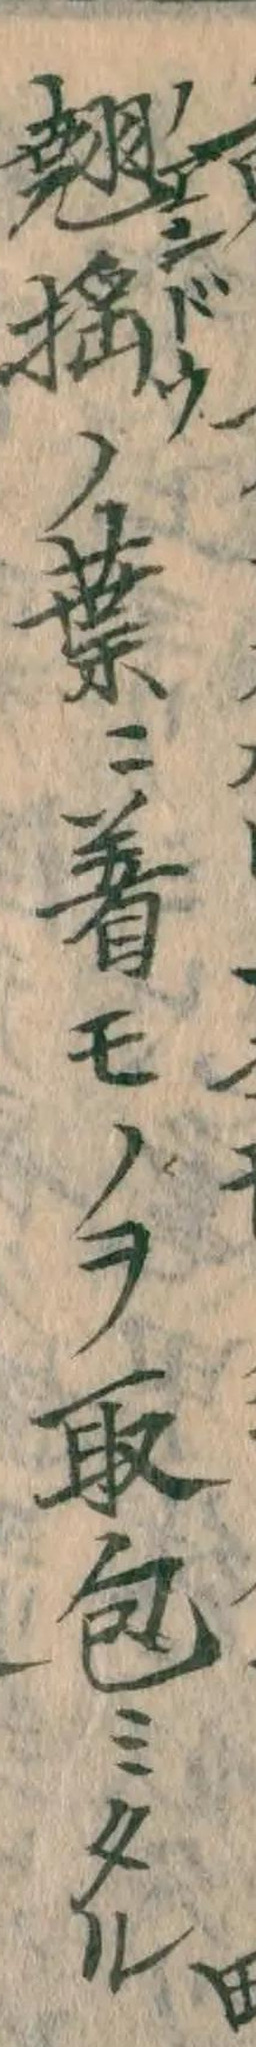翹揺ノ葉ニ着モノヲ取包ミタル
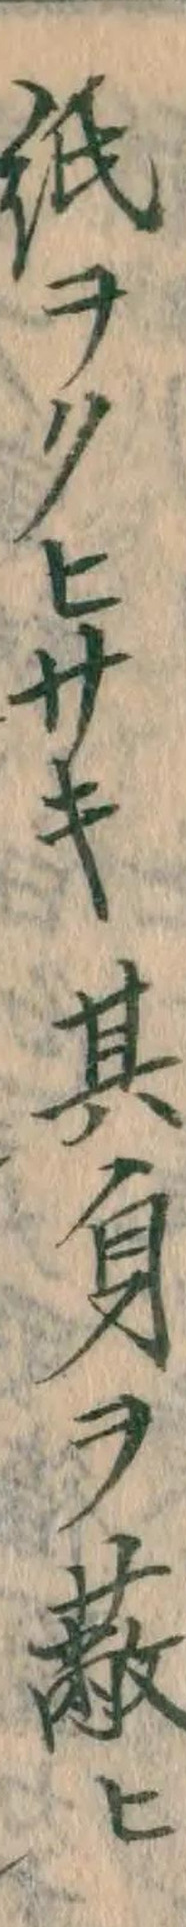紙ヲクヒサキ其身ヲ蔽ヒ
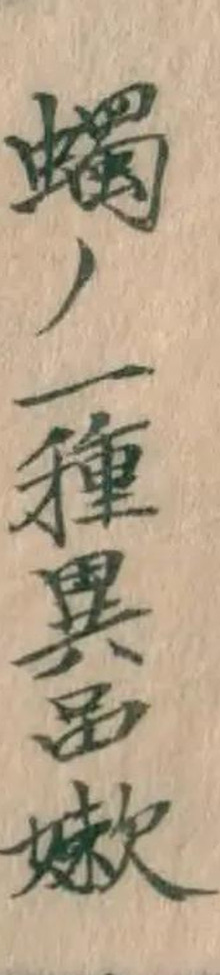蠋ノ一種異品嫩
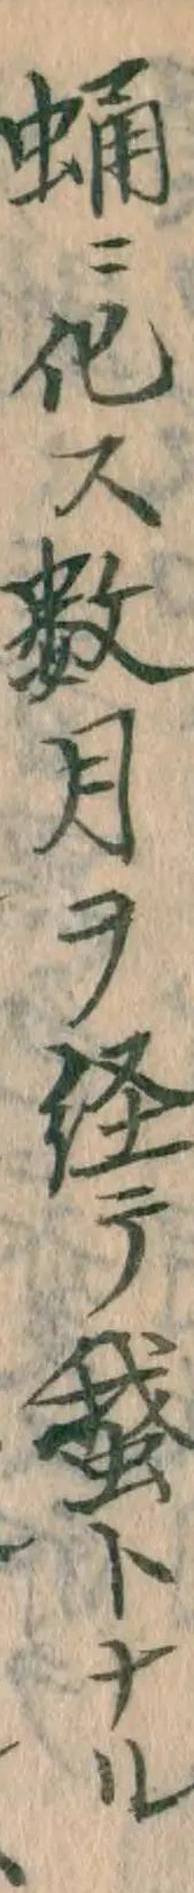蛹ニ化ス数月ヲ経テ䖸トナル
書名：千蟲譜 3巻. [3]
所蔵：国立国会図書館 National Diet Library, JAPAN
